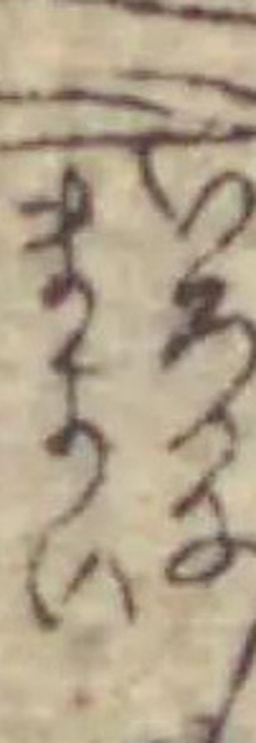まよい
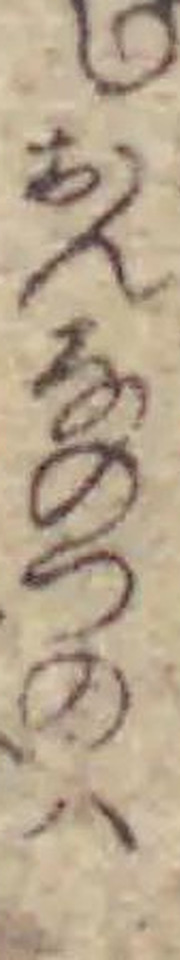おんなのつのは
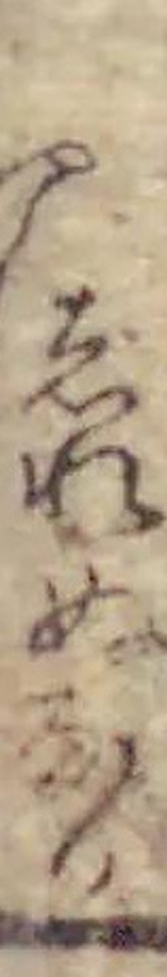しれぬなり
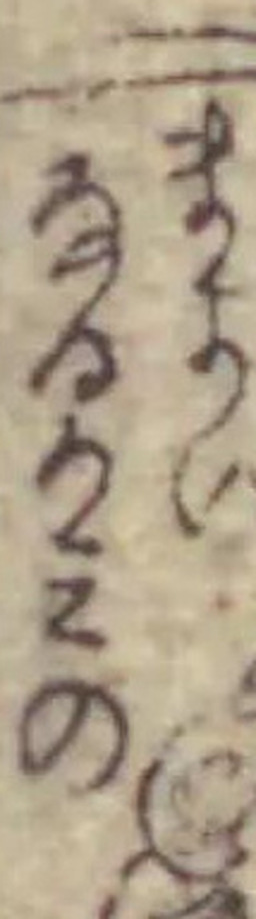なるかみの
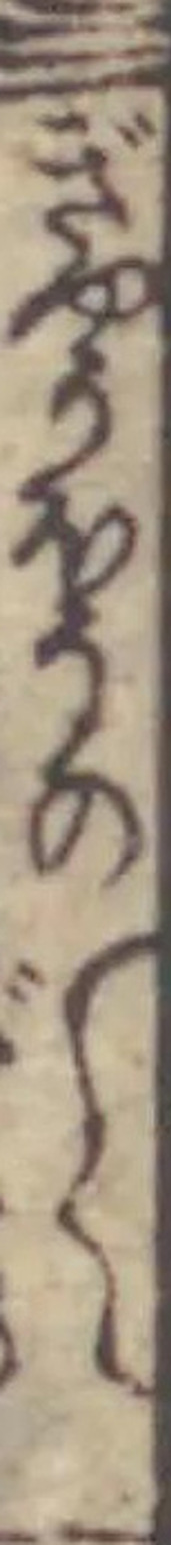ぎやうほうの
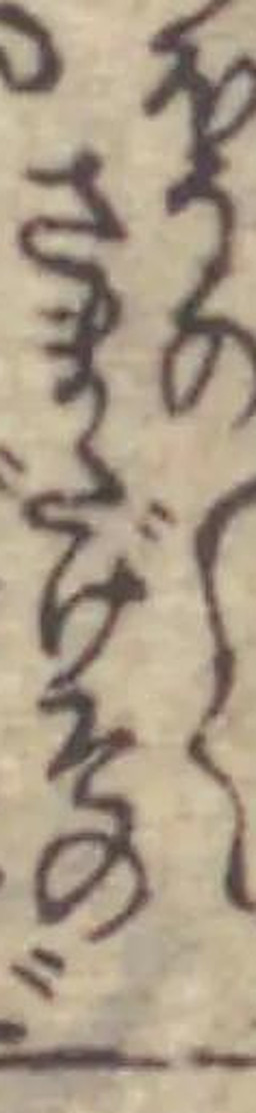さまたげその
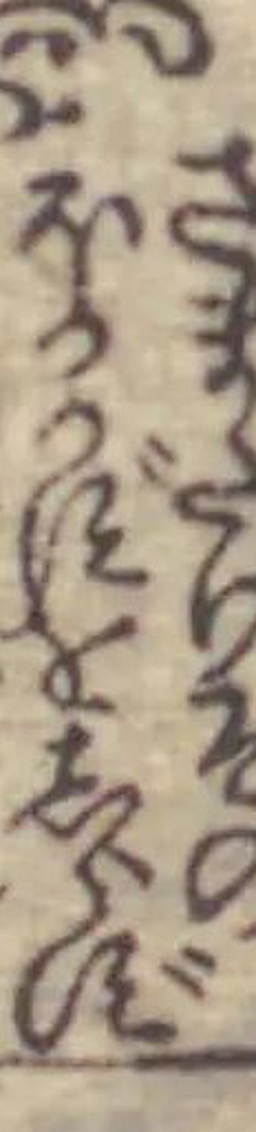ほかかずをしらず
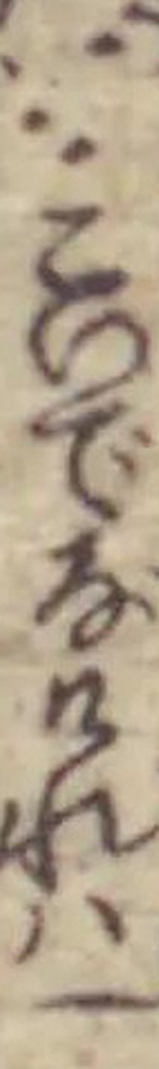こいでなけれは
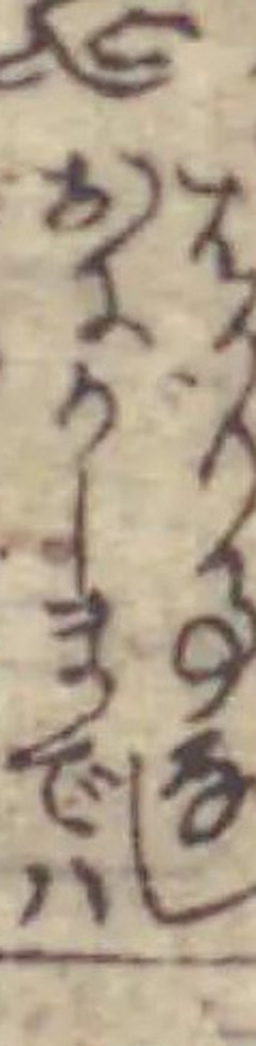おにがしまでは
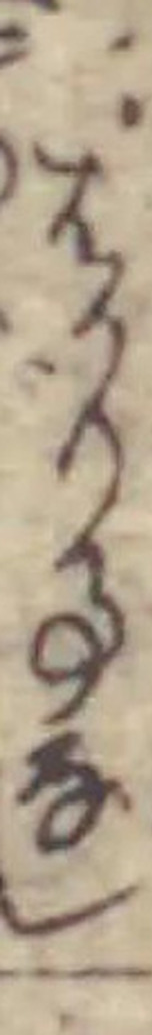はかり事なし
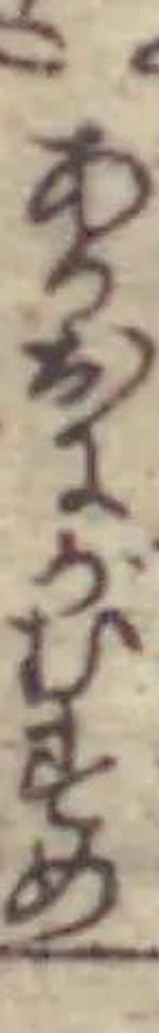あかおにがむすめ
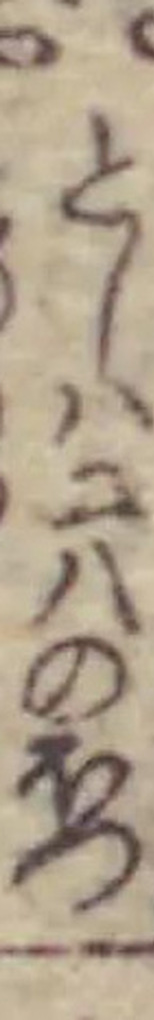としは二八のほつ
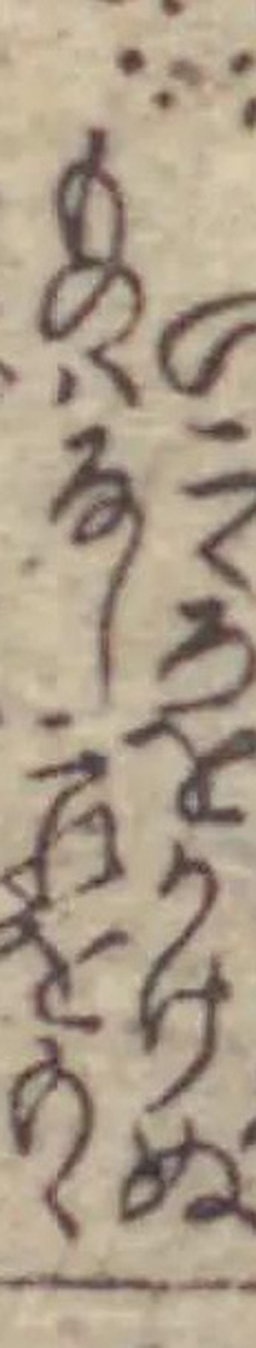ものはなしこれをもゝ
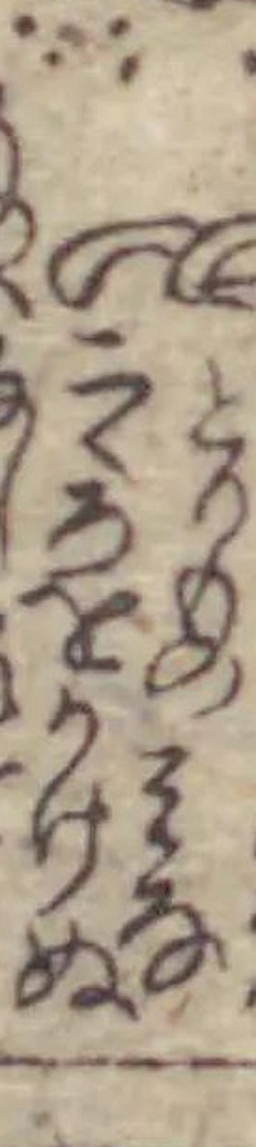こゝろをかけぬ
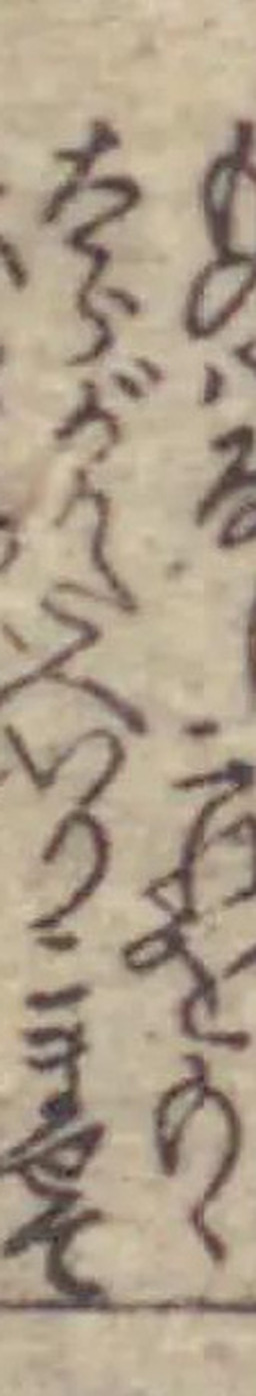太郎がかたへいりこませて
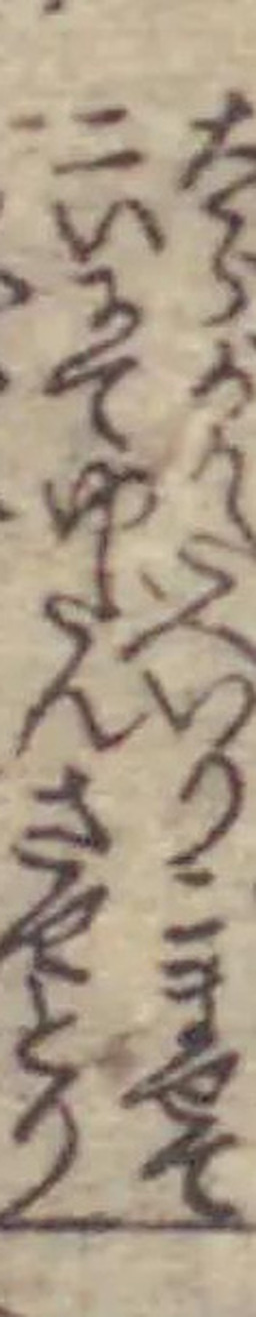こいにてゆたんさせとり
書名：桃太郎元服姿 2巻
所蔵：国立国会図書館 National Diet Library, JAPAN
